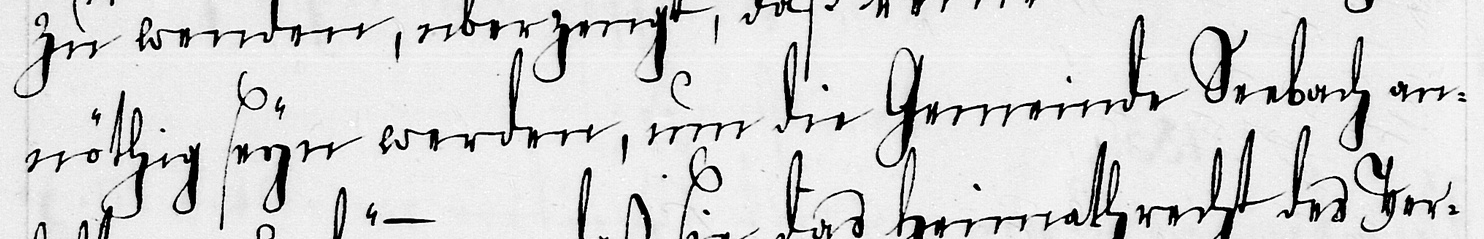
nöthig seyn werden, um die Gemeinde Seebach an¬
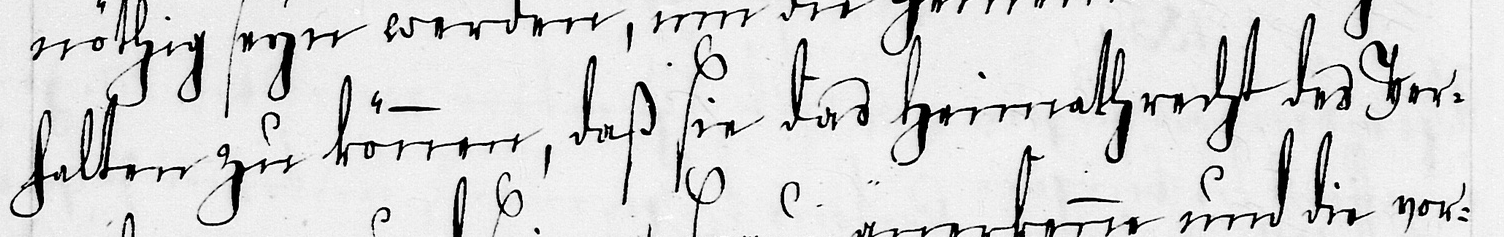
halten zu können, daß sie das Heimathrecht des Ver¬
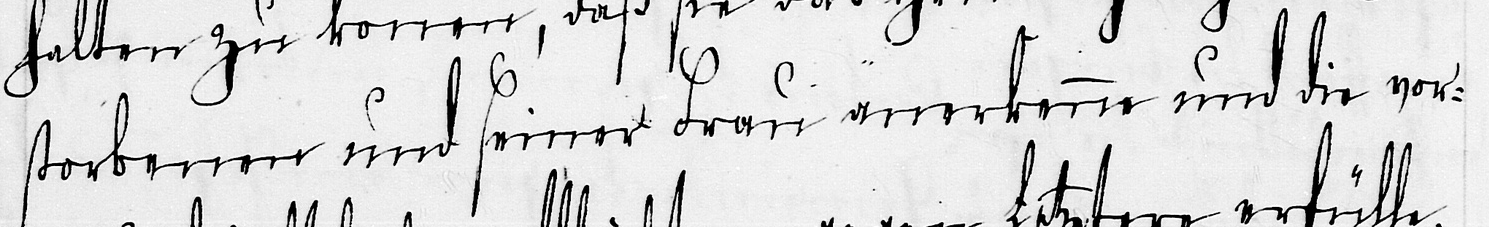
storbenen und seiner Frau anerkenne und die vor¬
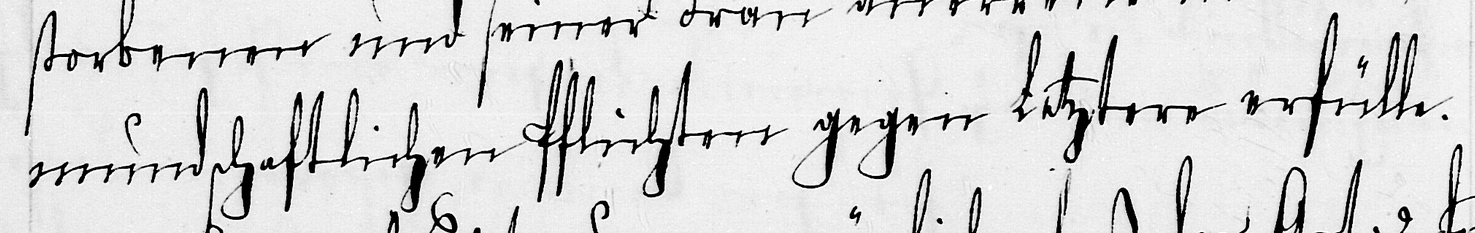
mundschaftlichen Pflichten gegen Letztere erfülle.
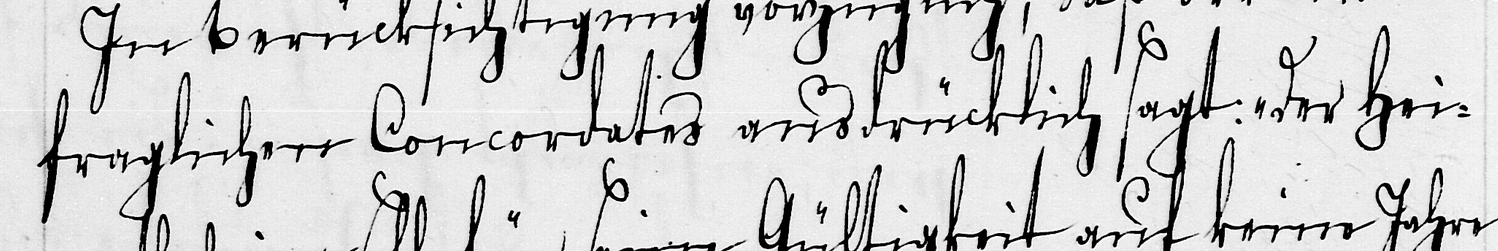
fraglichen Concordates ausdrücklich sagt: „Der Hei¬
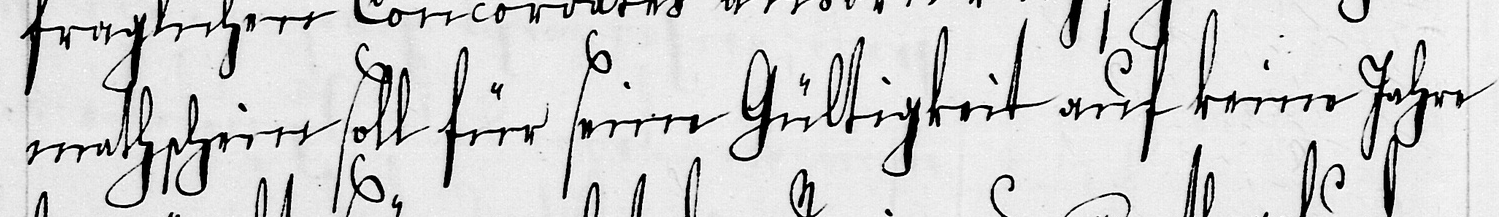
mathschein soll für seine Gültigkeit auf keine Jahre
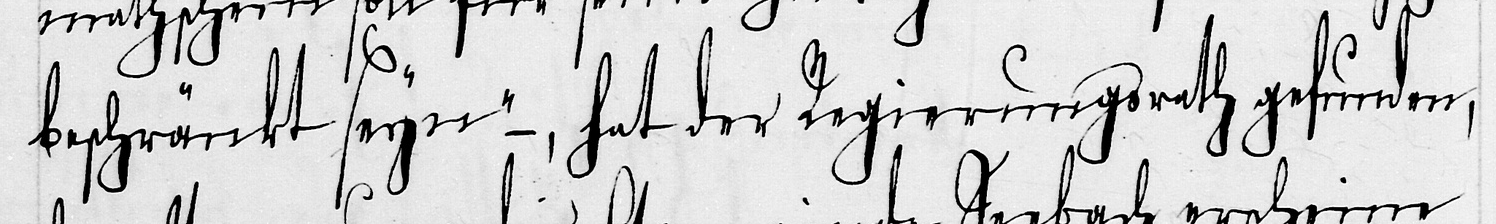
eschränkt seyn“ –, hat der Regierungsrath gefunden,
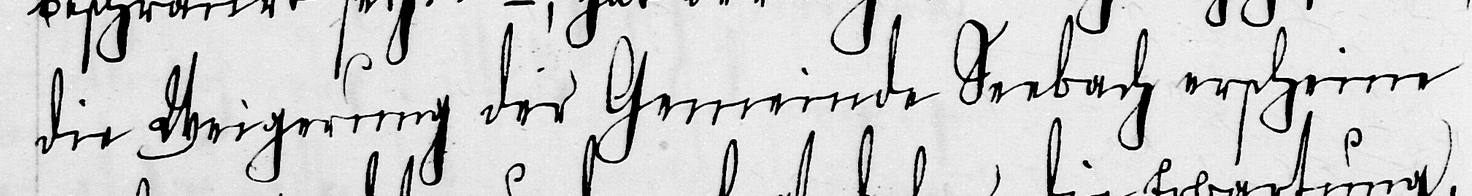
die Weigerung der Gemeinde Seebach erscheine
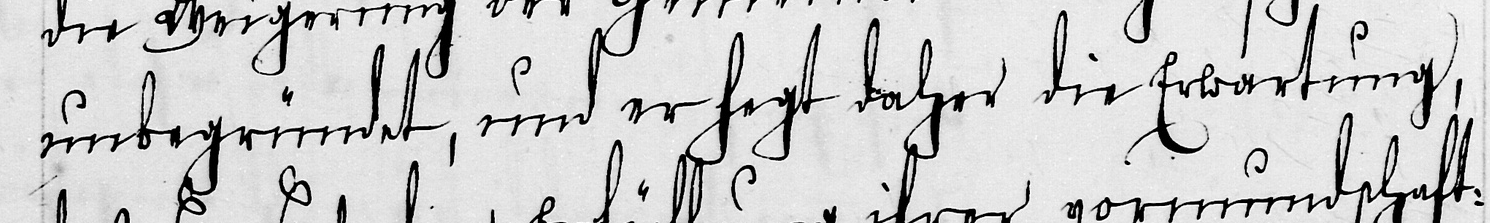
unbegründet, und er hegt daher die Erwartung,
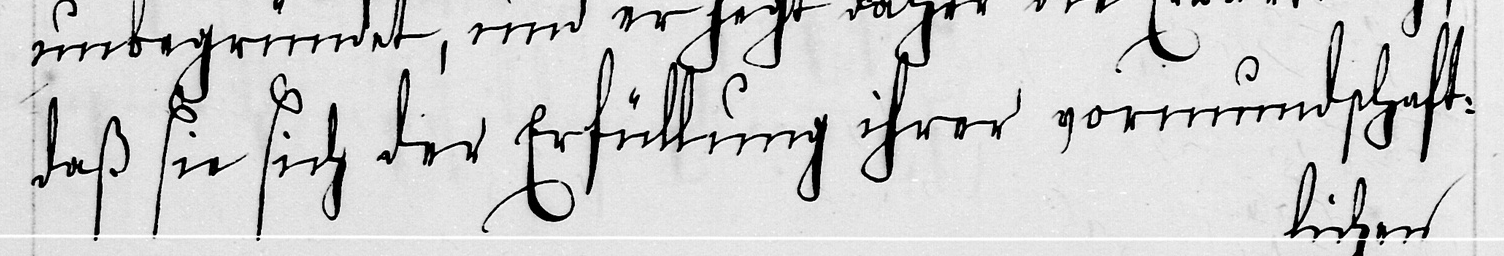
daß sie sich der Erfüllung ihrer vormundschaft-
